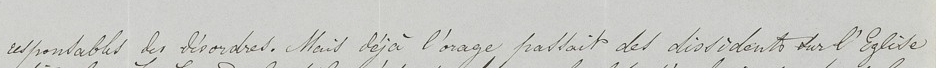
responsables des désordres. Mais déjà l'orage passait des dissidents sur l'Eglise
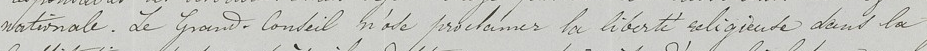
nationale. Le Grand-Conseil n'ose proclamer la liberté religieuse dans la
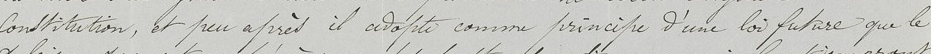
Constitution, et peu après il adopte comme principe d'une loi future que le
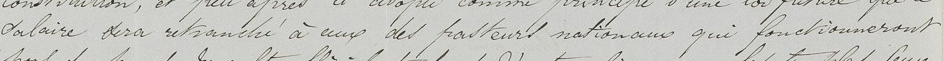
salaire sera retranché à ceux des pasteurs nationaux qui fonctionneront
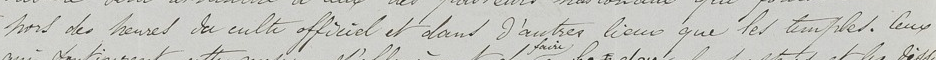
hors des heures du culte officiel et dans d'autres lieux que les temples. Ceux
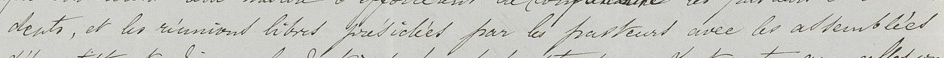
dents, et les réunions libres présidées par les pasteurs avec les assemblées
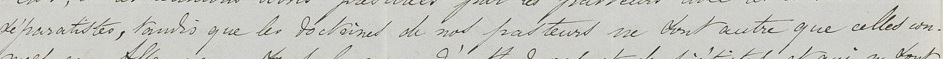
séparatistes, tandis que les doctrines de nos pasteurs ne sont autre que celles con-
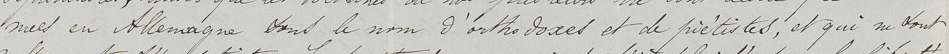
nues en Allemagne sous le nom d'orthodoxes et de piétistes, et qui ne sont
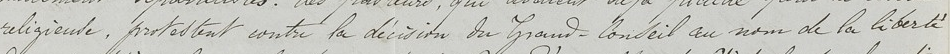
religieuse, protestent contre la décision du Grand-Conseil au nom de la liberté
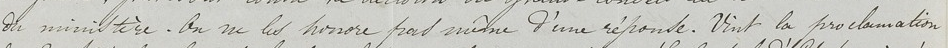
du ministère. On ne les honore pas même d'une réponse. Vint la proclamation
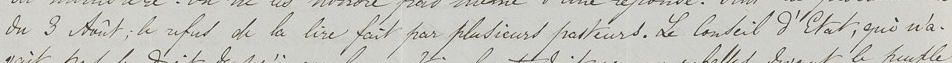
du 3 Août; le refus de la lire fait par plusieurs pasteurs. Le Conseil d'Etat, qui n'a-
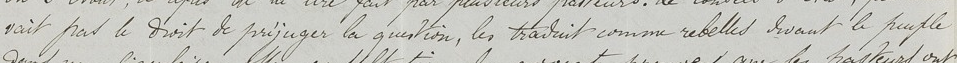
vait pas le droit de préjuger la question, les traduit comme rebelles devant le peuple
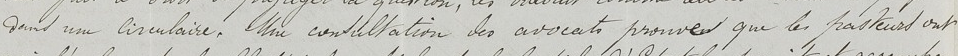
dans une Circulaire. Une consultation des avocats prouve que les pasteurs ont
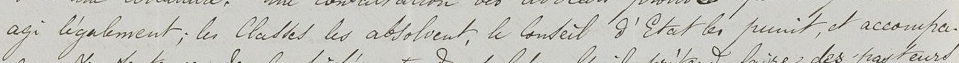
agi légalement; les Classes les absolvent, le Conseil d'Etat les punit, et accompa-
